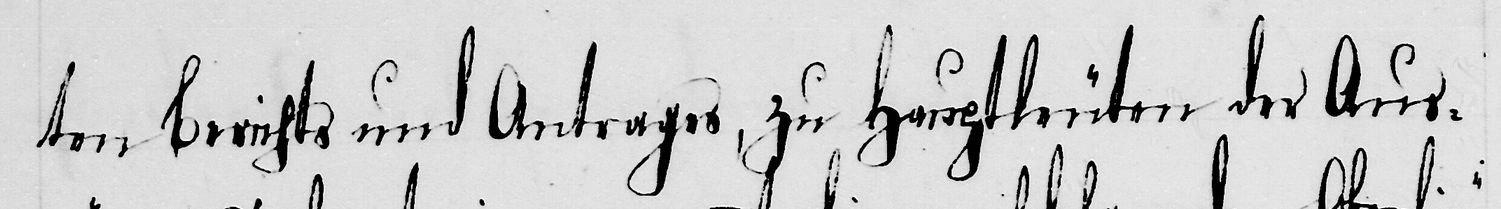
ten Berichts und Antrages, zu Hauptleuten der Aus¬
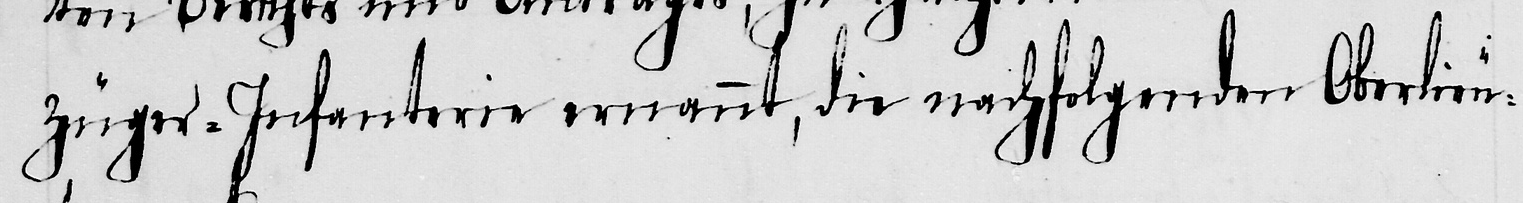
züger-Infanterie ernannt, die nachfolgenden Oberlieu¬
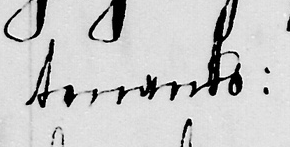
tenants:
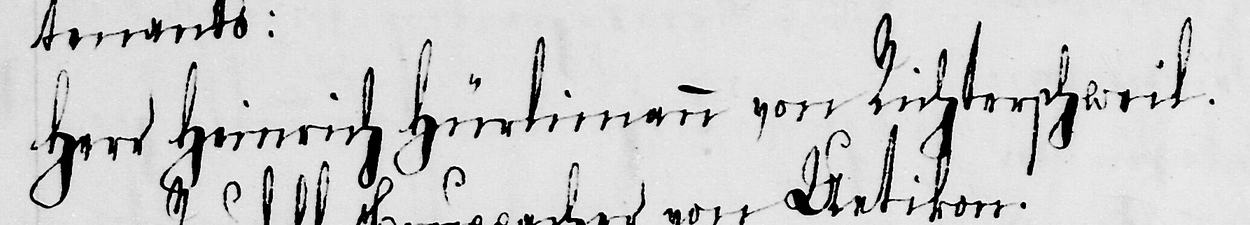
Herr Heinrich Hürlimann von Richterschweil.
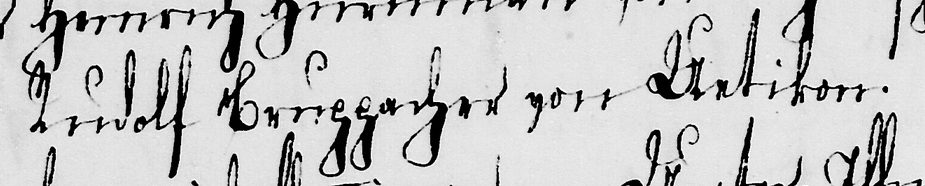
Rudolf Bruppacher von Uetikon.
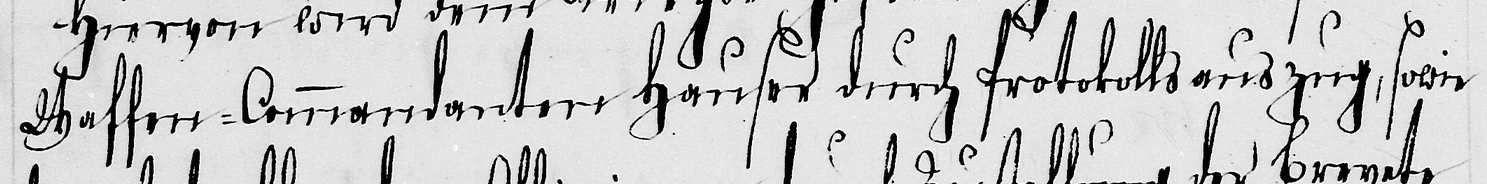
Waffen-Commandanten Hauser durch Protokollsauszug, sowie
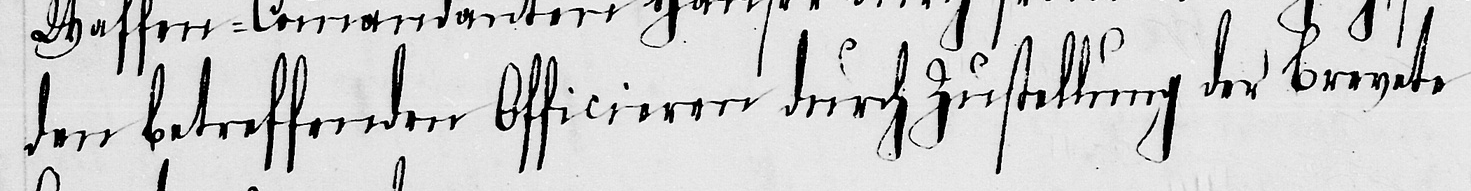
den betreffenden Officieren durch Zustellung der Brevete
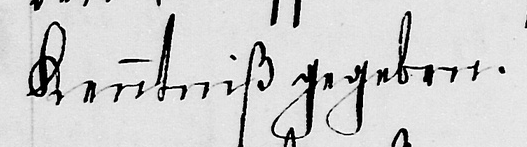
Kenntniß gegeben.
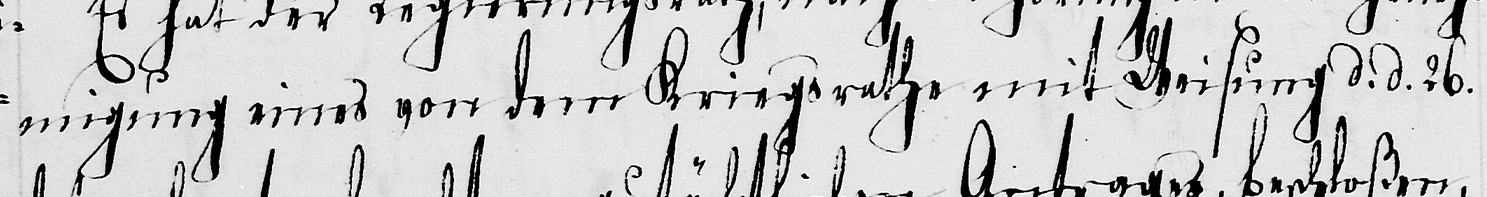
migung eines von dem Kriegsrathe mit Weisung d. d. 26.
